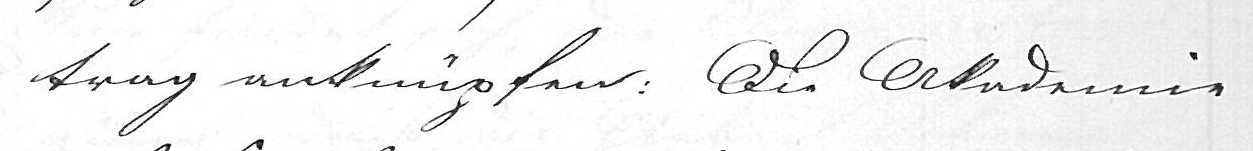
trag anknüpfen. Die Akademie
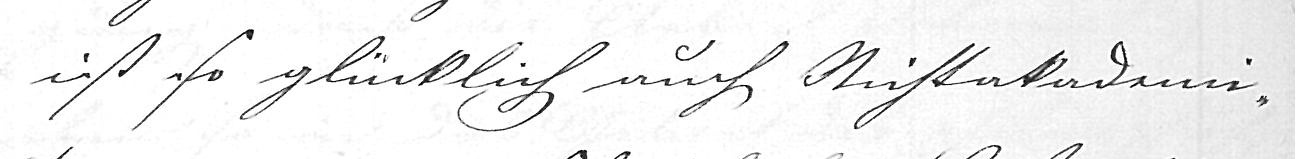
ist so glücklich auch Nichtakademi-
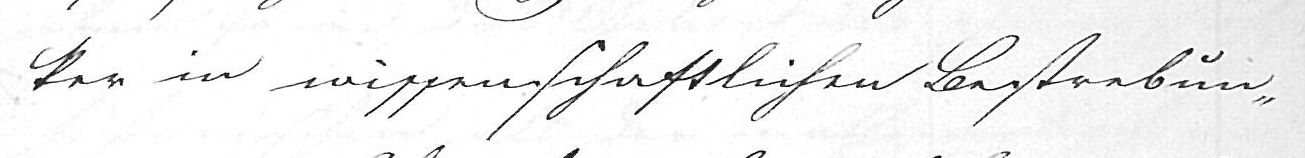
ker in wissenschaftlichen Bestrebun-
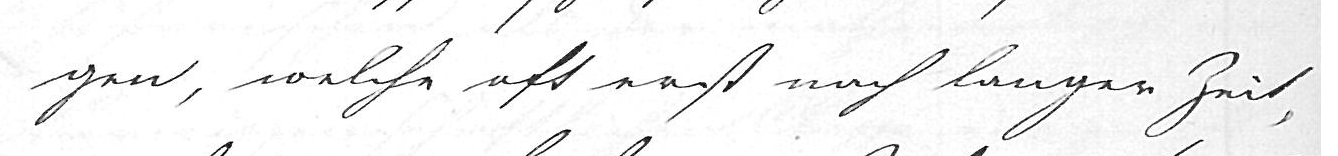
gen, welche oft erst nach lange Zeit,
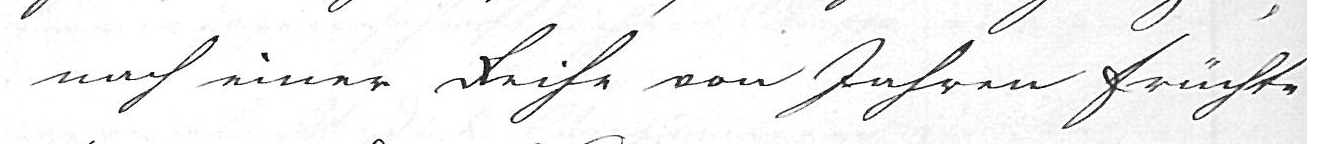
nach einer Reihe von Jahren Früchte
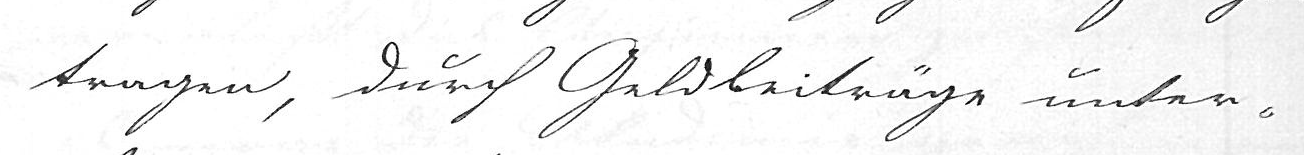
tragen, durch Geldbeiträge unter-
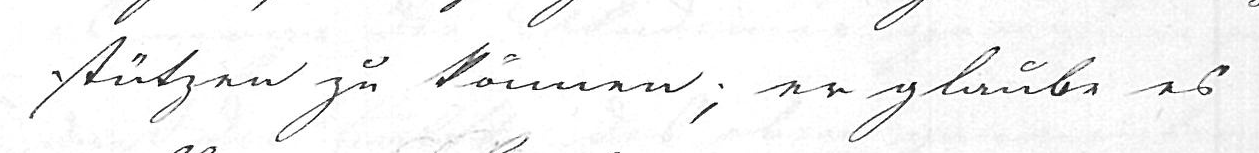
stützen zu können; er glaube es
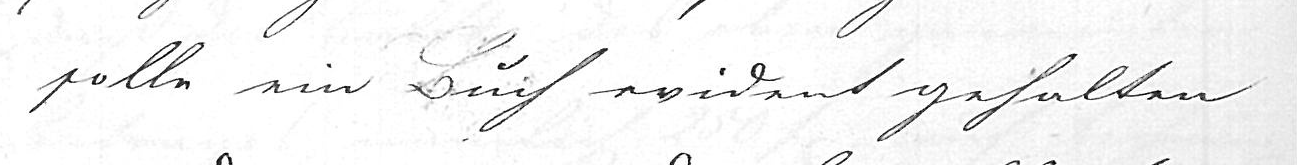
solle ein Buch evident gehalten
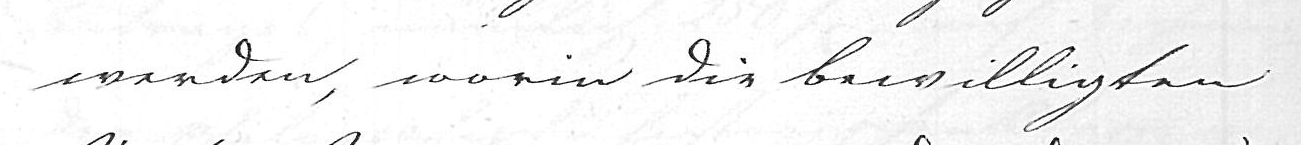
werden, worin die bewilligten
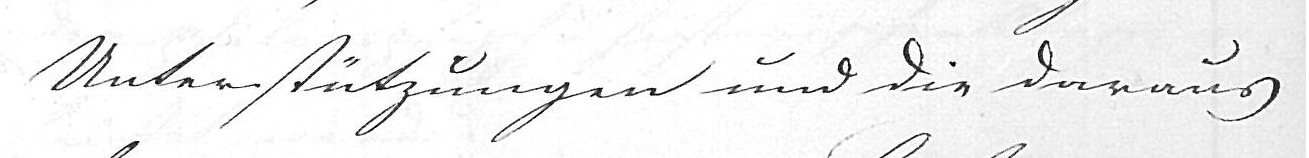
Unterstützungen und die daraus
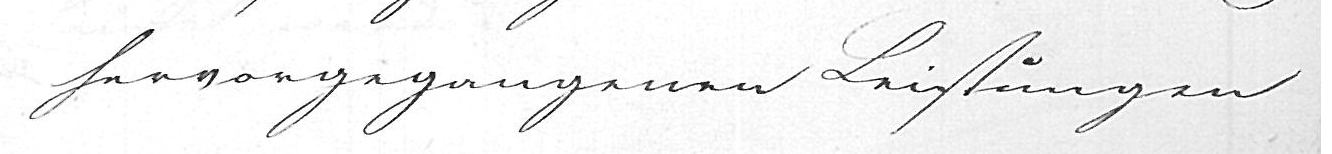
hervorgegangenen Leistungen
